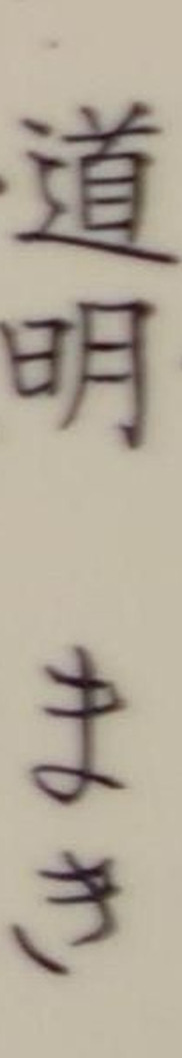道明まき
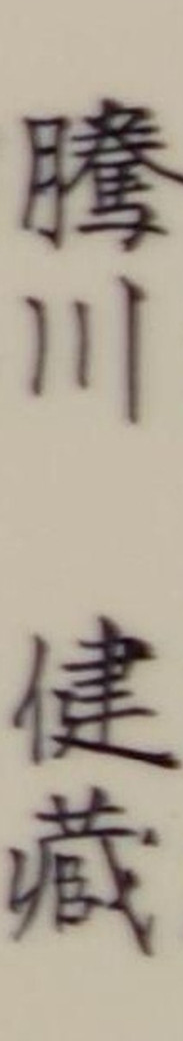藤川健蔵
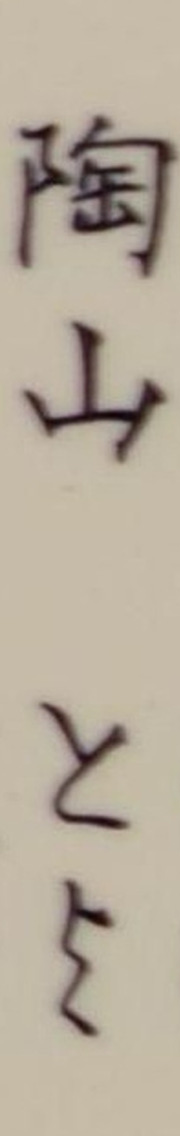陶山とよ
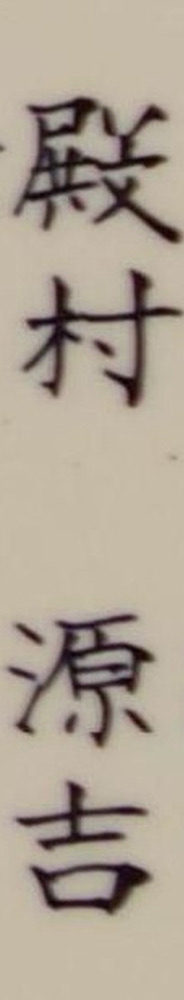殿村源吉
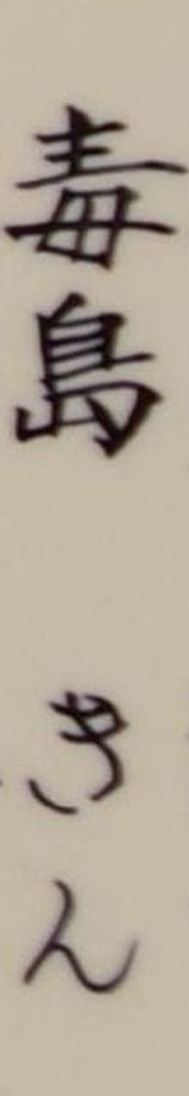毒島きん
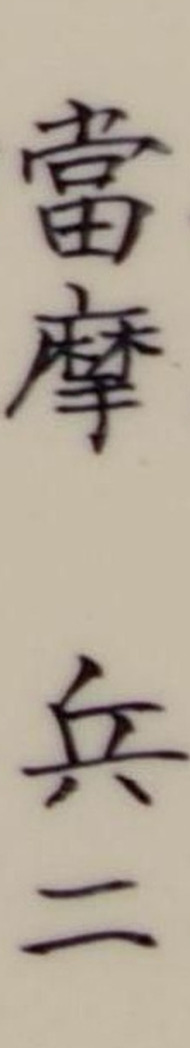當摩兵二
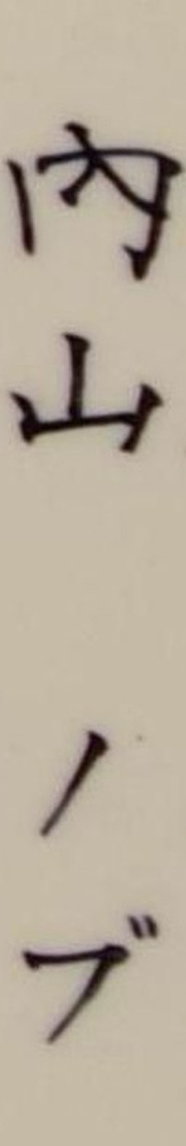内山ノブ
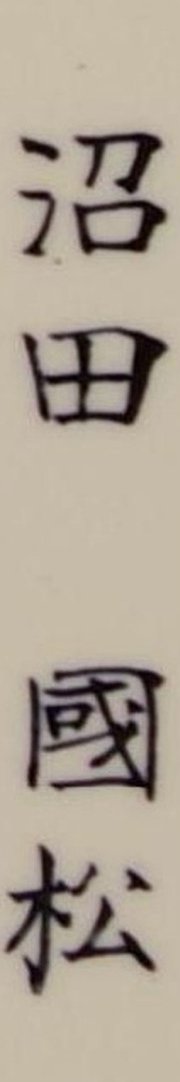沼田國松
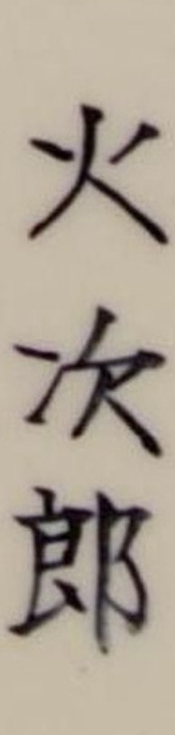火次郎
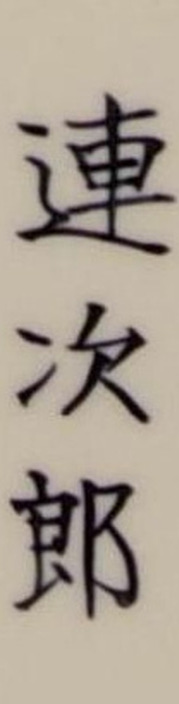連次郎
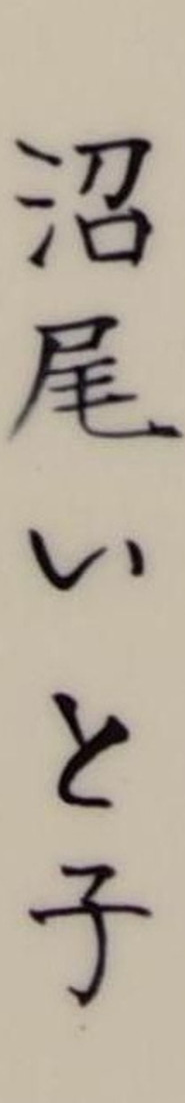沼尾いと子
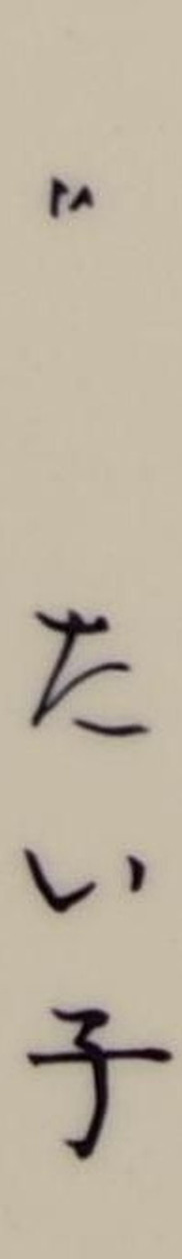たい子
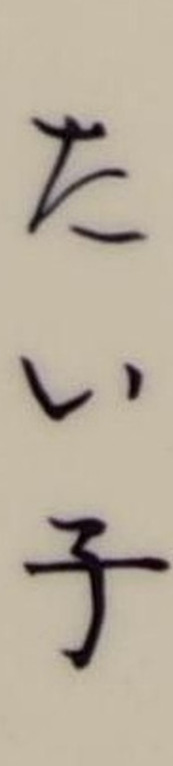たい子
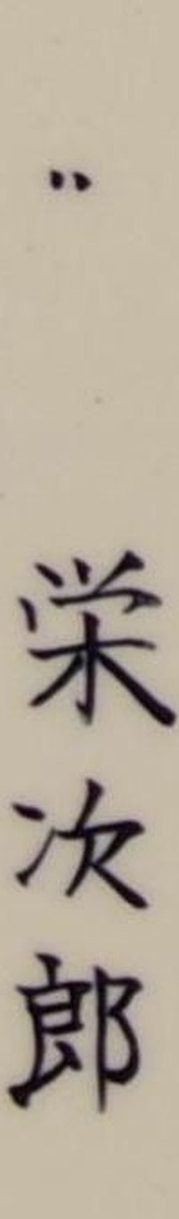栄次郎
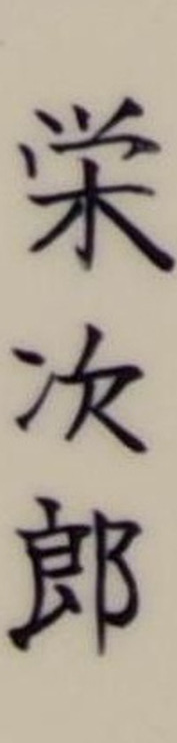栄次郎
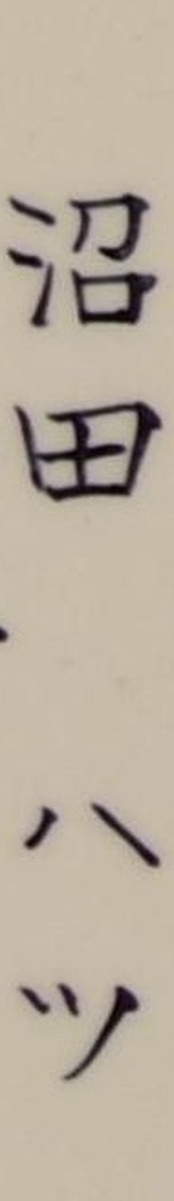沼田ハツ
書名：M~S
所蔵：高野山金剛峯寺
